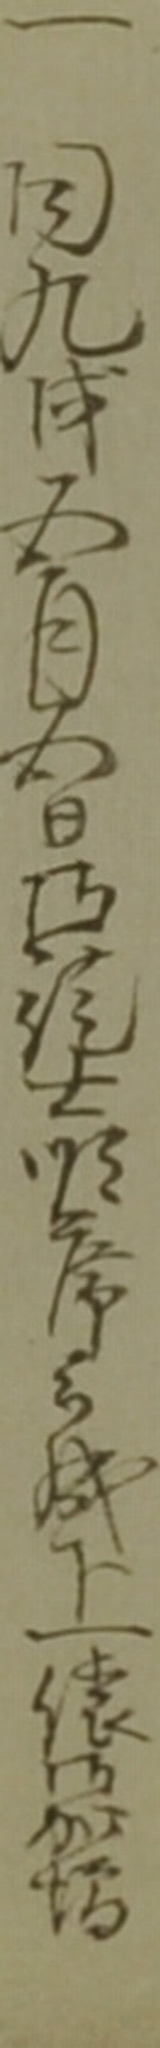一同九戌五月五日御徒士順席被成下一俵御加増
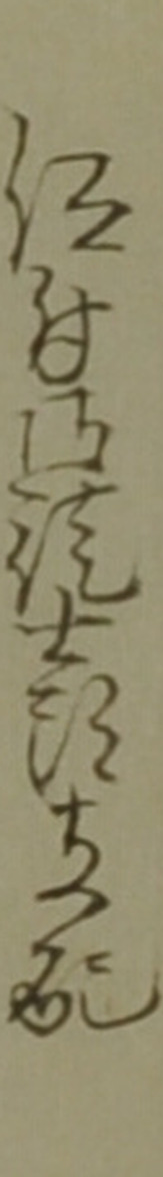仰付御徒士頭支配
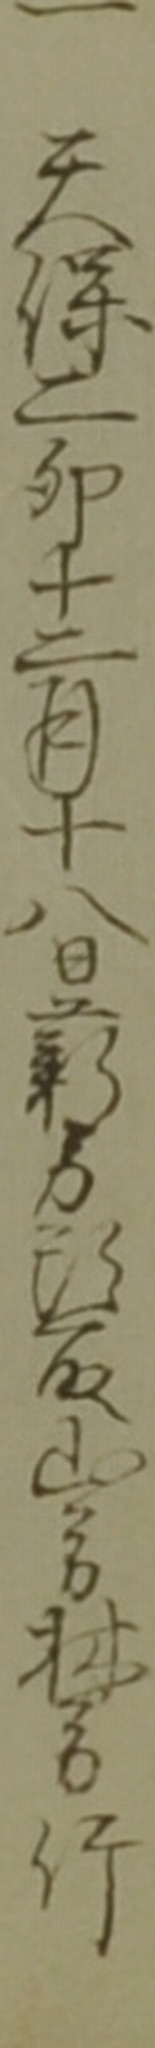一天保二卯十二月十八日薪方頭取山方林方竹
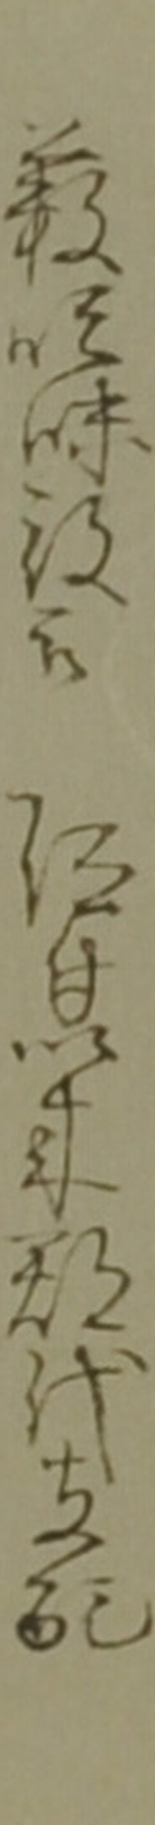薮吟味役被仰付以来郡代支配
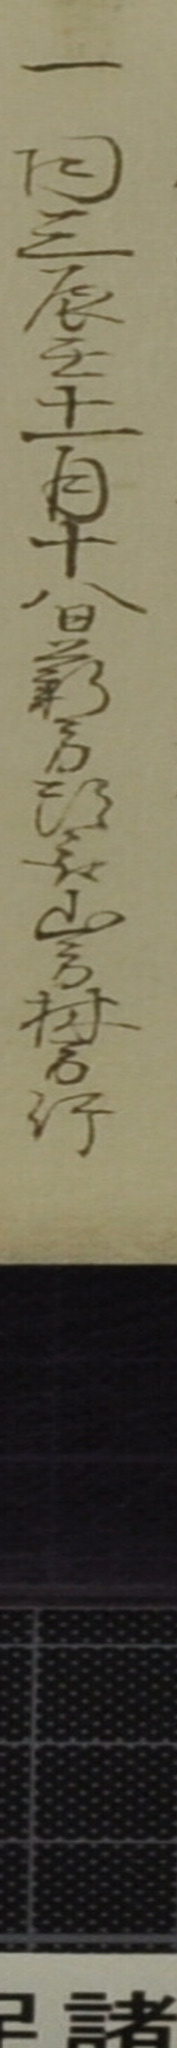一同三辰閏十一月十八日薪方頭取山方林方竹
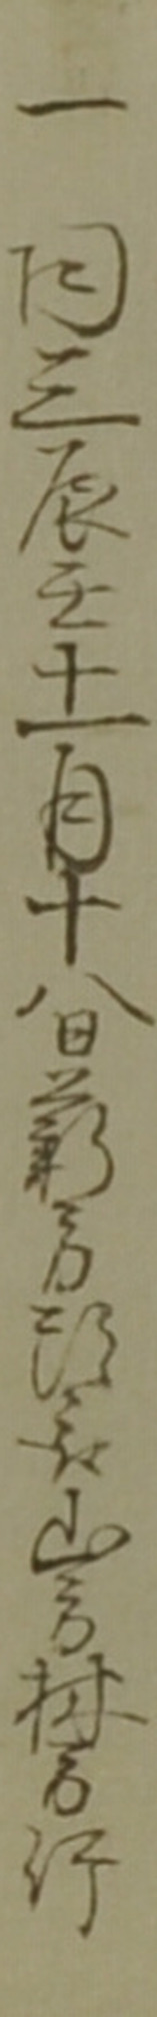一同三辰閏十一月十八日薪方頭取山方林方竹
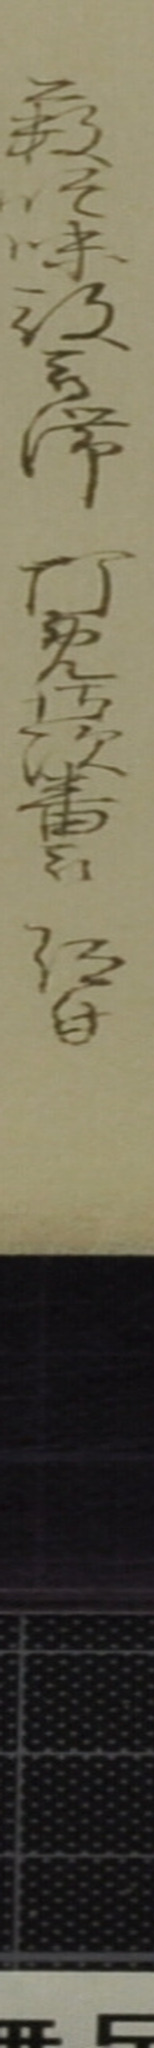薮吟味役被滞御免御次番被仰付
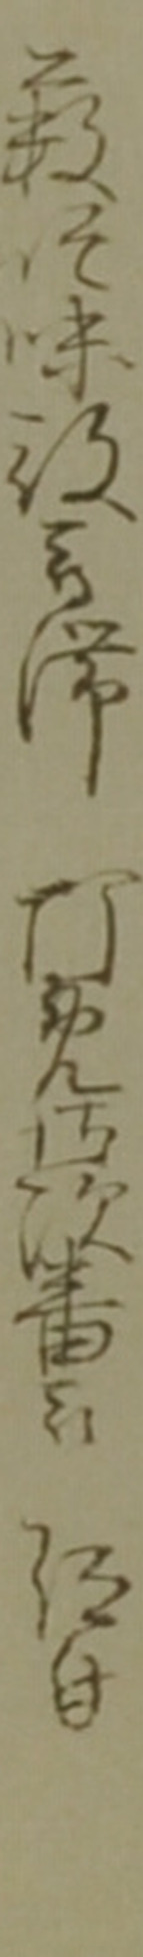薮吟味役被滞御免御次番被仰付
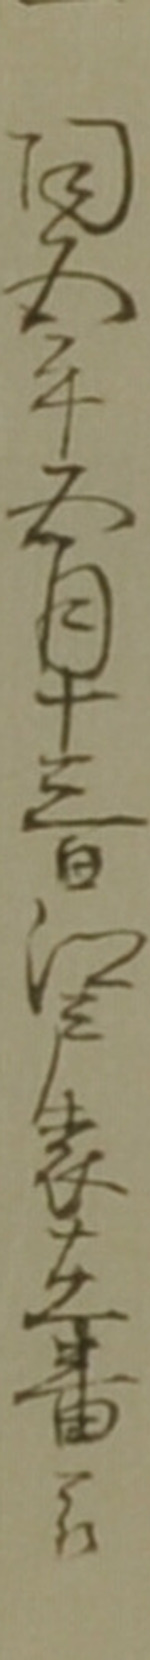一同五午五月十三日江戸表在番被
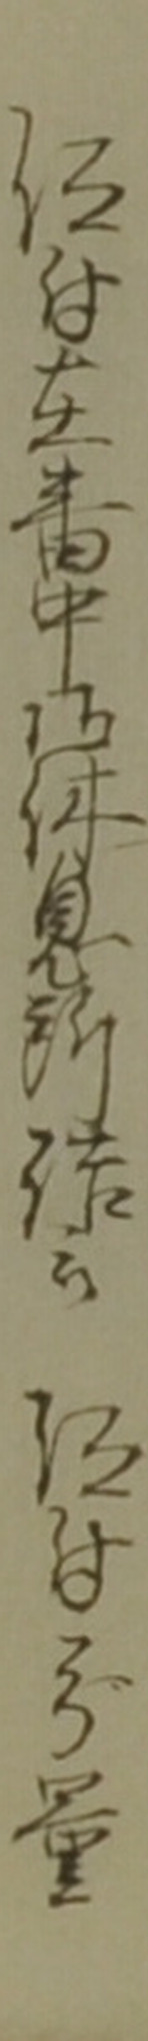仰付在番中御休息所詰被仰付分量
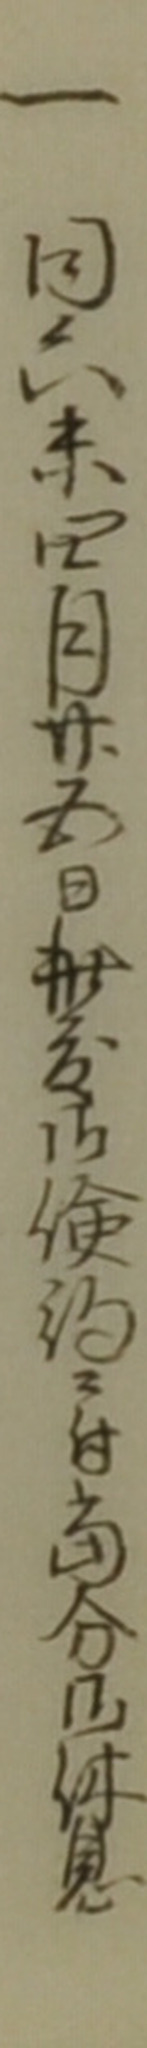一同六未四月廿五日此度御倹約ニ付当分御休息
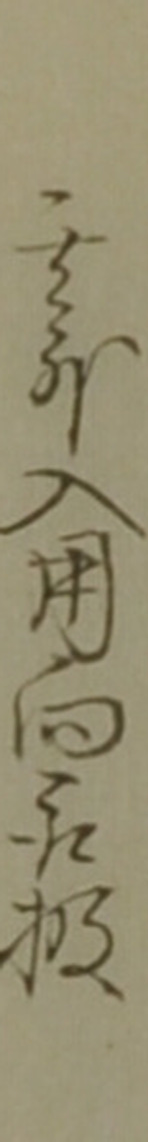其外入用向取扱
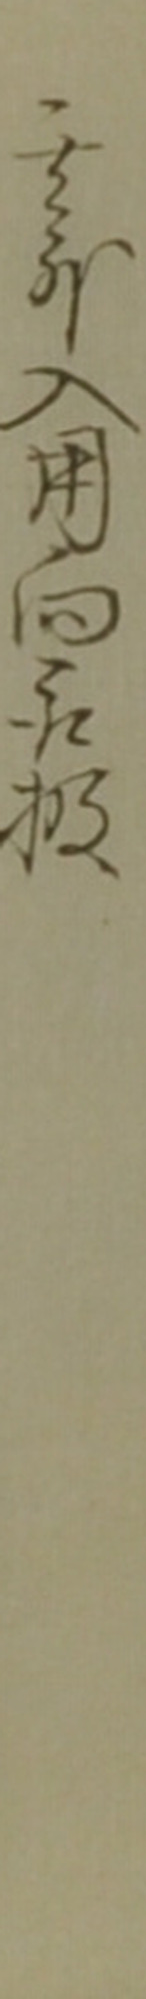其外入用向取扱
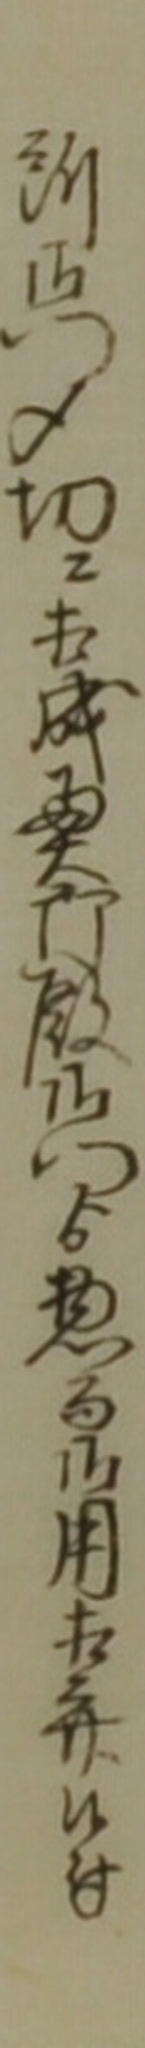所御門〆切ニ相成奥御殿御門ゟ惣而御用相弁候付
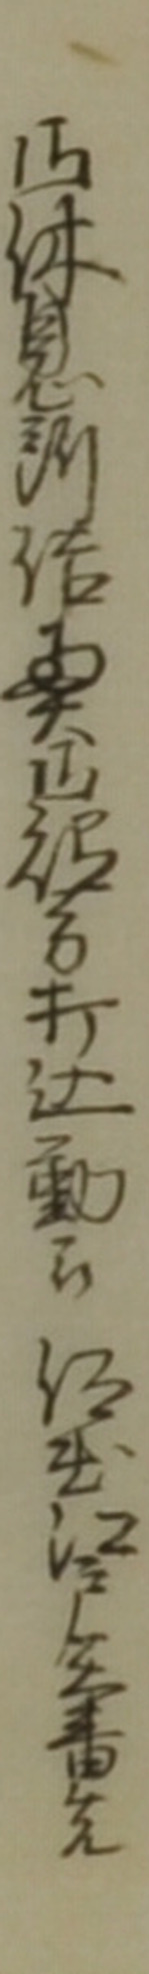御休息所詰奥御賄方打込勤被仰出江戸在番先
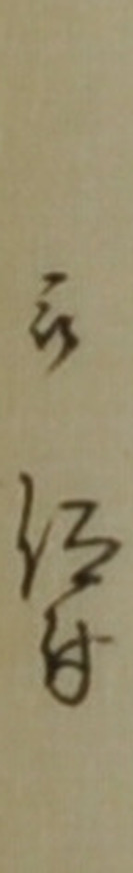被仰付
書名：無足諸士勤仕録（六）
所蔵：伊那市立高遠町図書館・合同会社AMANE
